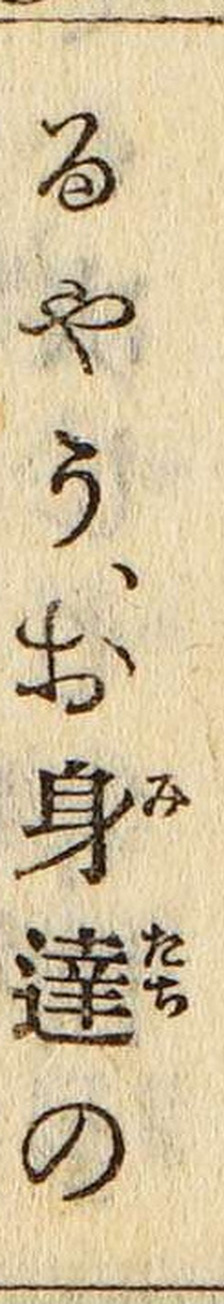るやうお身達の
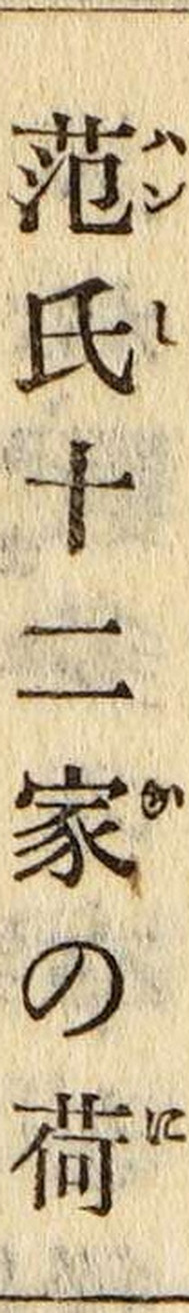范氏十二家の荷
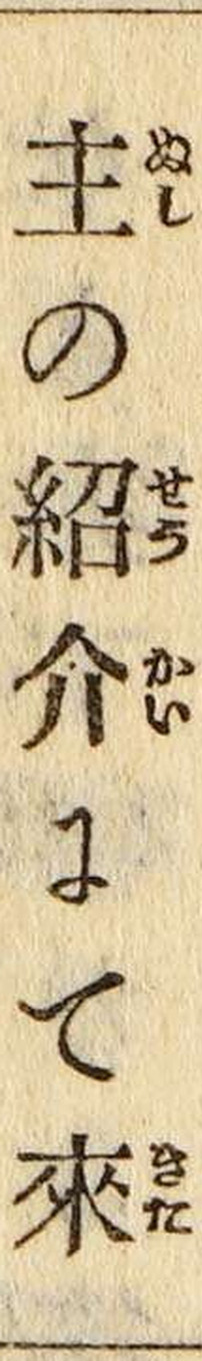主の紹介にて来
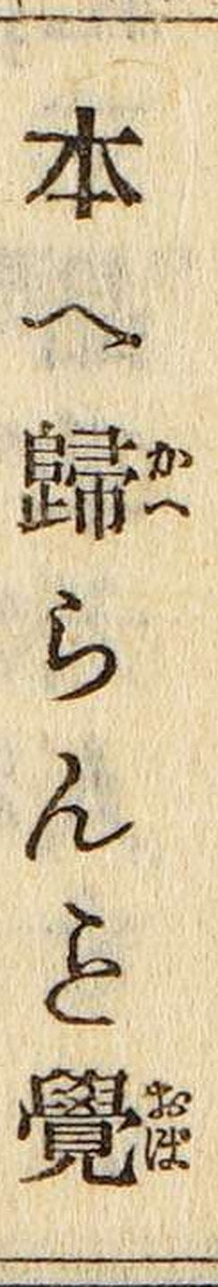本へ帰らんこと覚
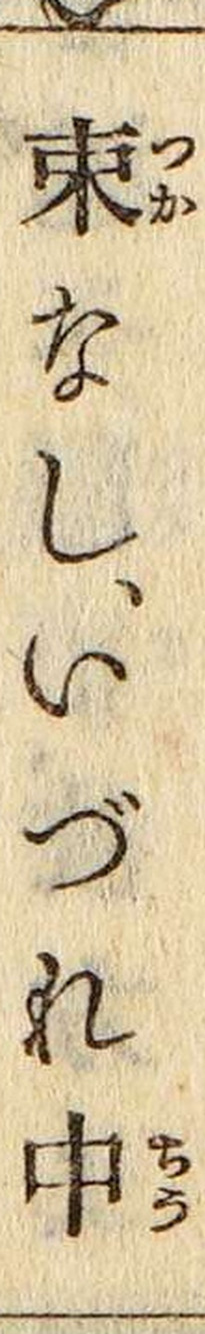束なし、いづれ中
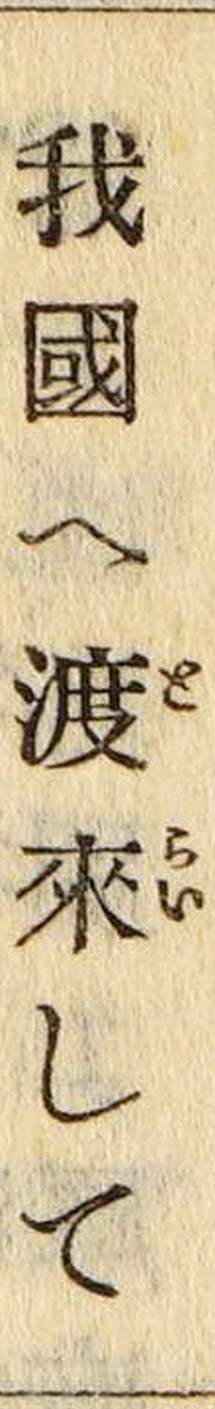我国へ渡来して
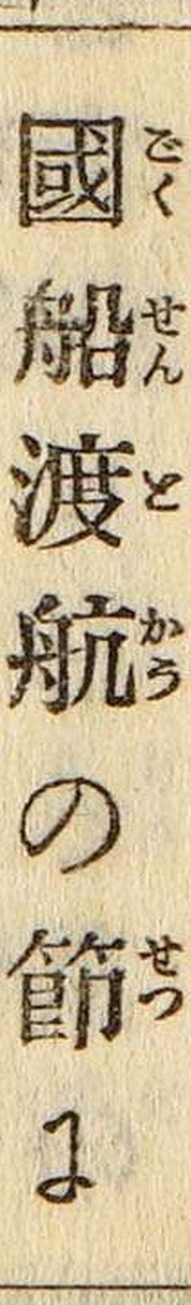国船渡航の節に
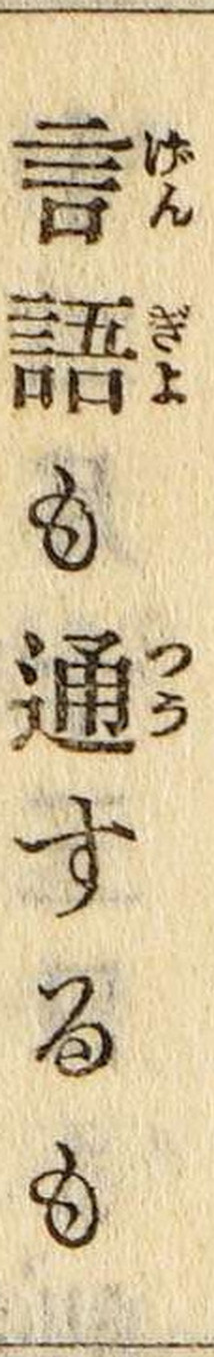言語も通するも
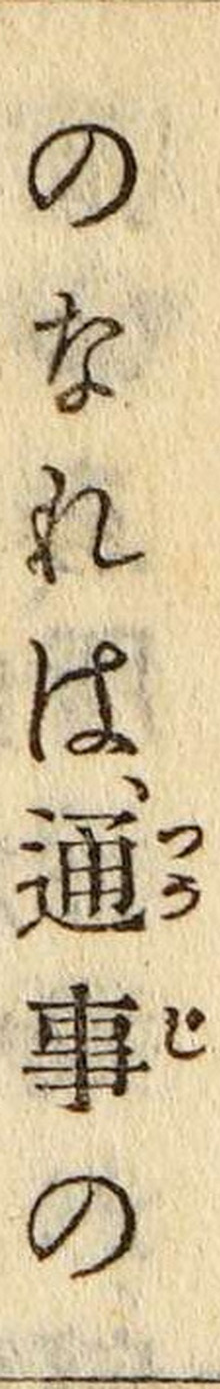のなれは通事の
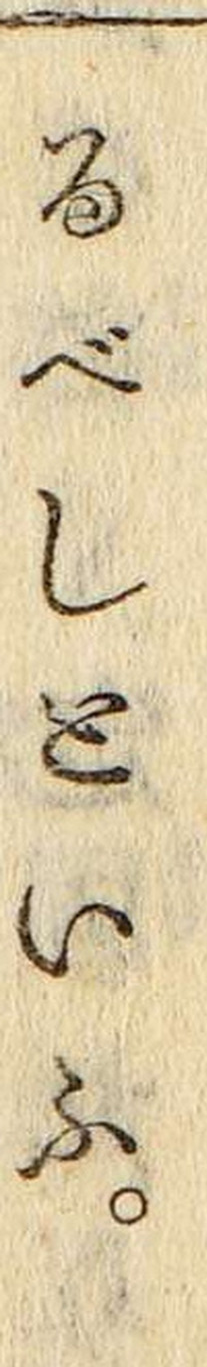るべしといふ。
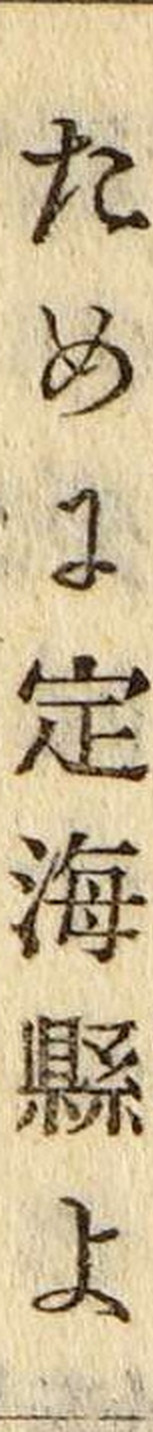ために定海県よ
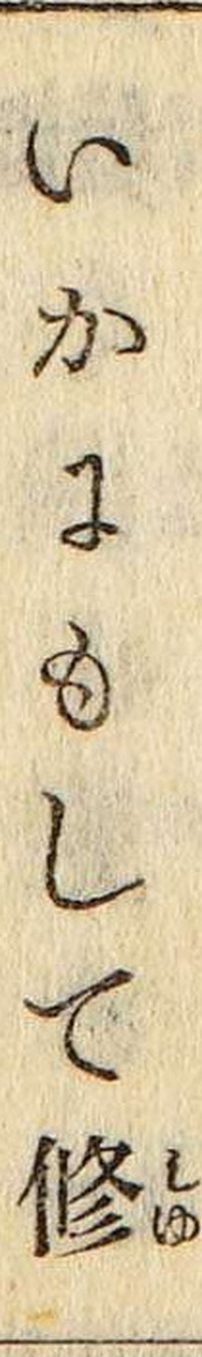いかにもして修
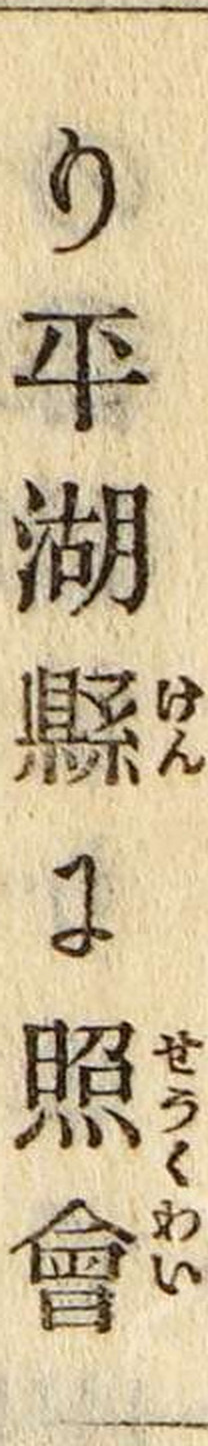り平湖県に照会
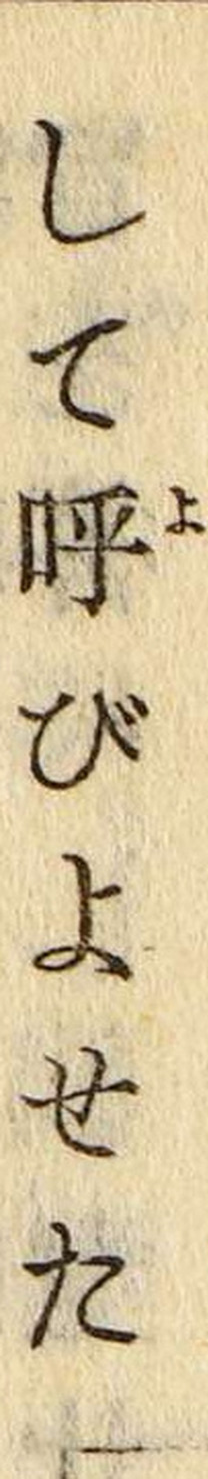して呼びよせた
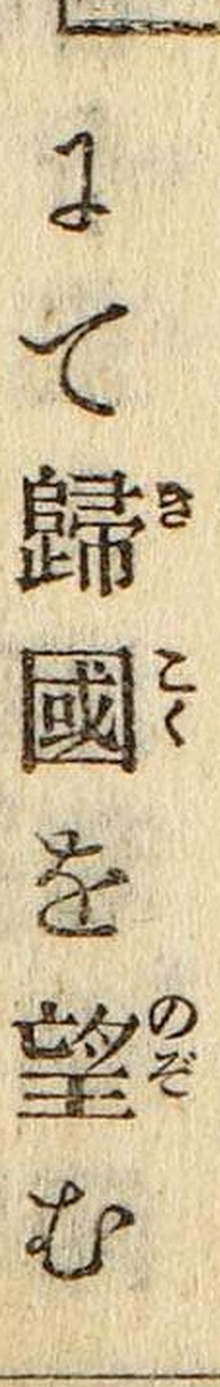にて帰国を望む

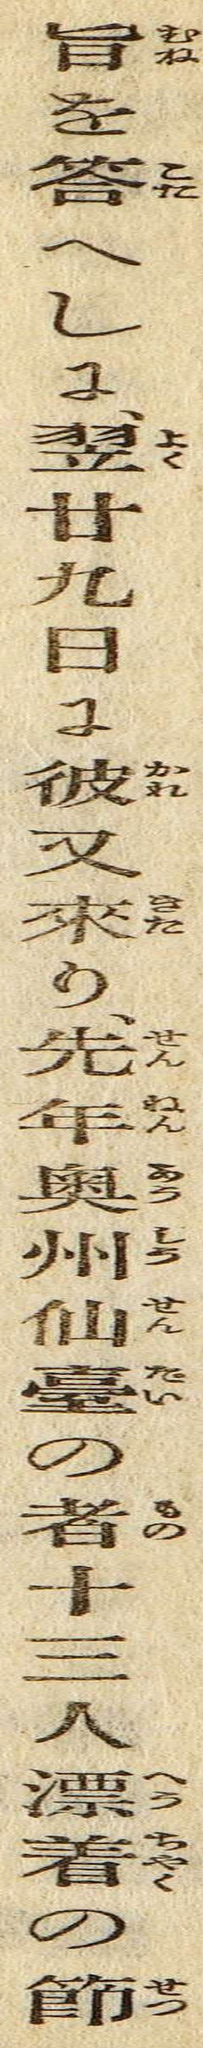旨を答へしに翌廿九日に彼又來り先年奥州仙台の者十三人漂着の節
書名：日本漂流譚
